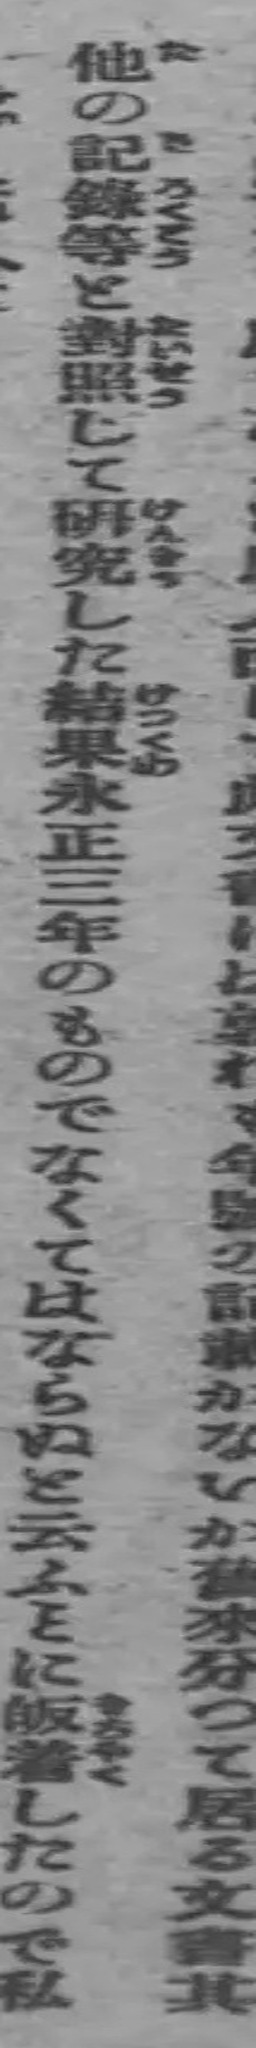他の記録等と対照して研究した結果永正三年のものでなくてはならぬと云ふことに皈着したので私
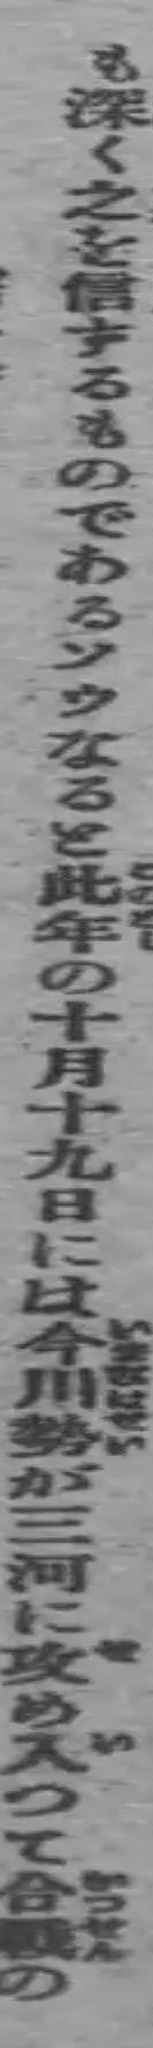も深く之を信ずるものであるソウなると此年の十月十九日には今川勢が三河に攻め入つて合戦の
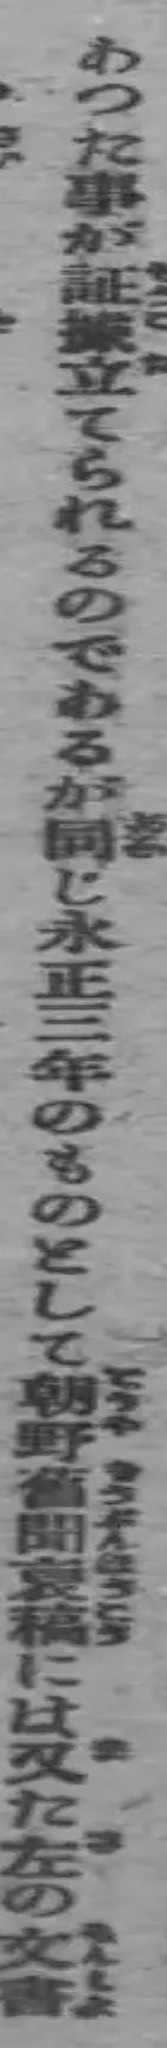あつた事が証拠立てられるのであるが同じ永正三年のものとして朝野旧聞裒稿には又た左の文書
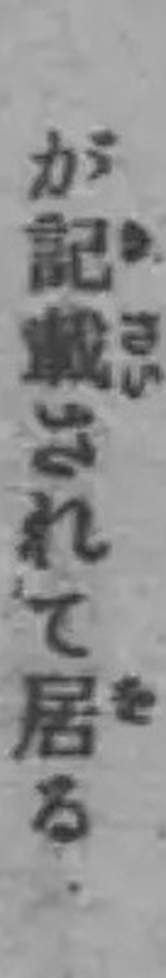が記載されて居る
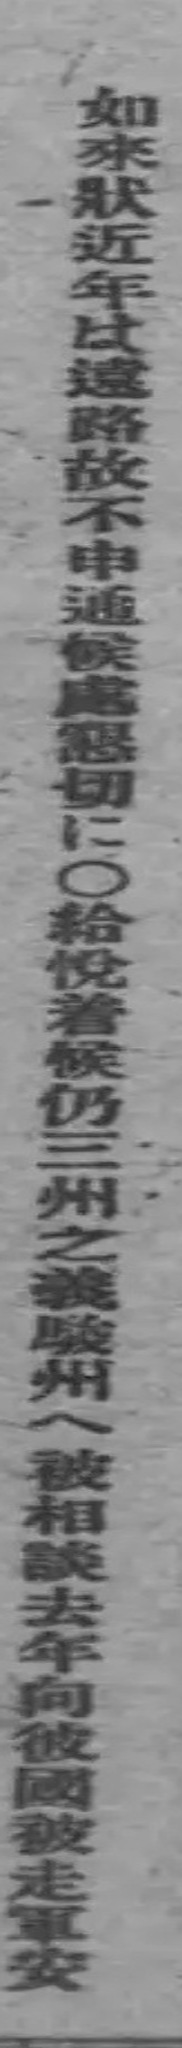如来状近年は遠路故不申通候処懇切に〇給悦着候仍三州之義駿州へ被相談去年向彼国被走軍安
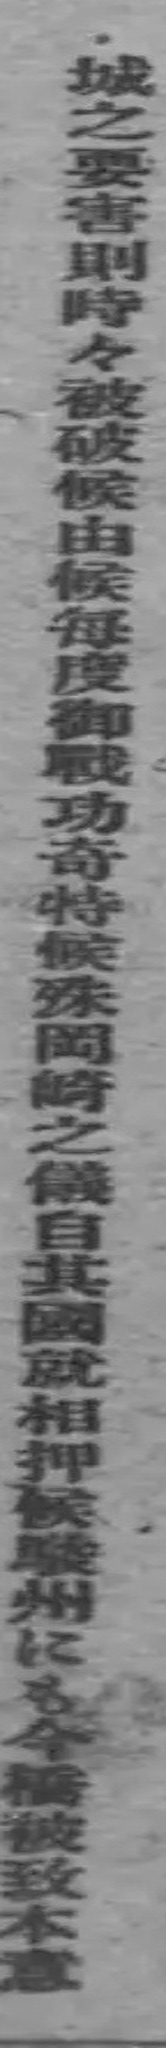城之要害則時々被破候由候毎度御戦功奇特候殊岡崎之儀自其国就相押候駿州にも今橋被致本意
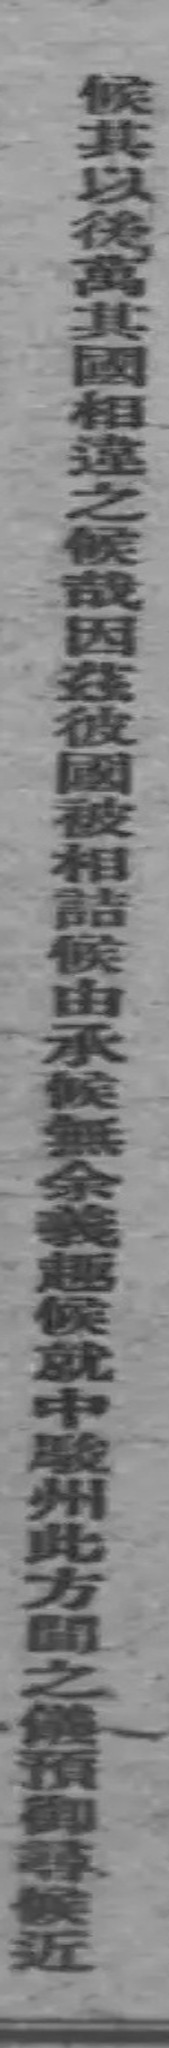候其以後萬其国相違之候哉因茲彼国被相詰候由承候無余義趣候就中駿州此方間之儀預御尋候近
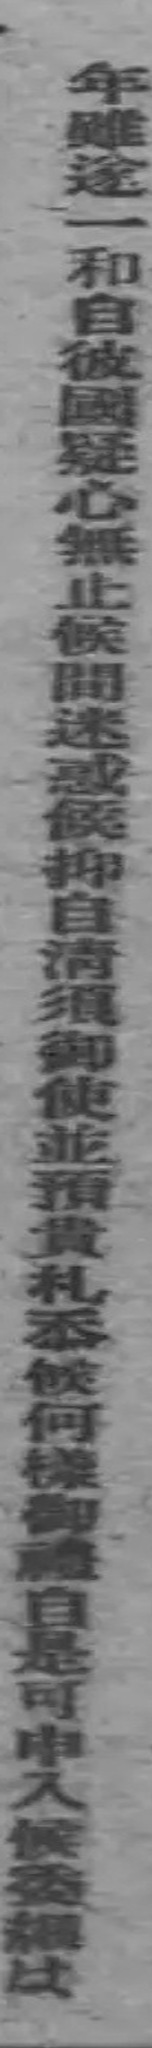年雖遂一和自彼国疑心無止候間迷惑候抑自清須御使並預貴札忝候何様御礼自是可申入候委細は
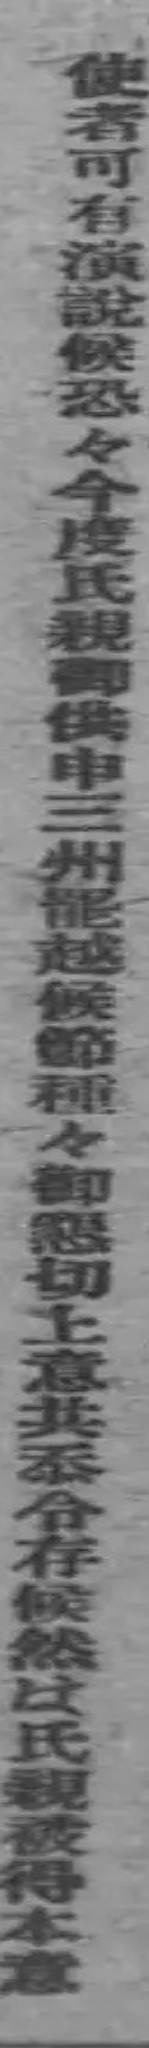使者可有演説候恐々今度氏親御供申三州罷越候節種々御懇切上意共忝令存候然は氏親被得本意
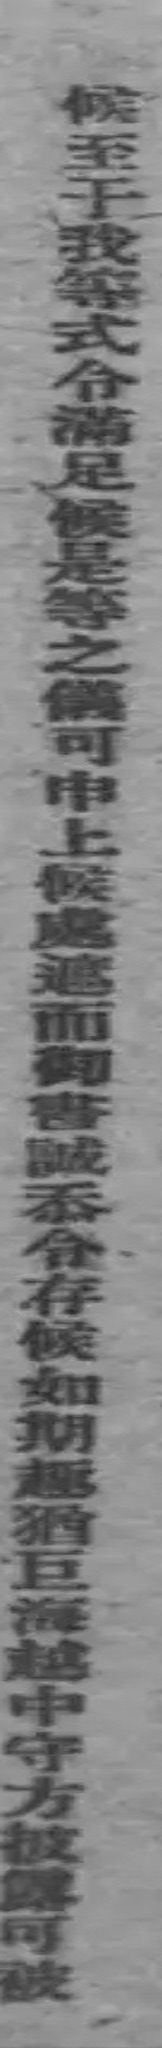候至于我等式令満足候是等之儀可申上候処遮而御書誠忝令存候如斯趣猶巨海越中守方被露可被
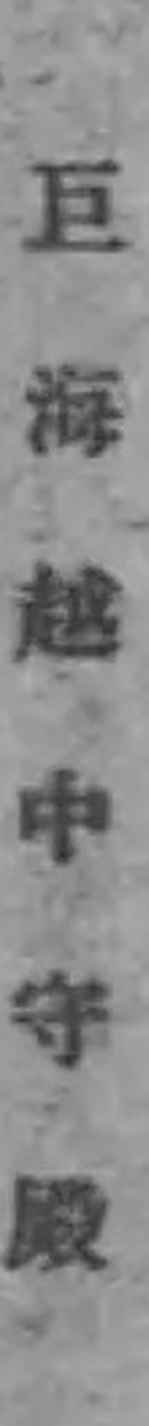巨海越中守殿
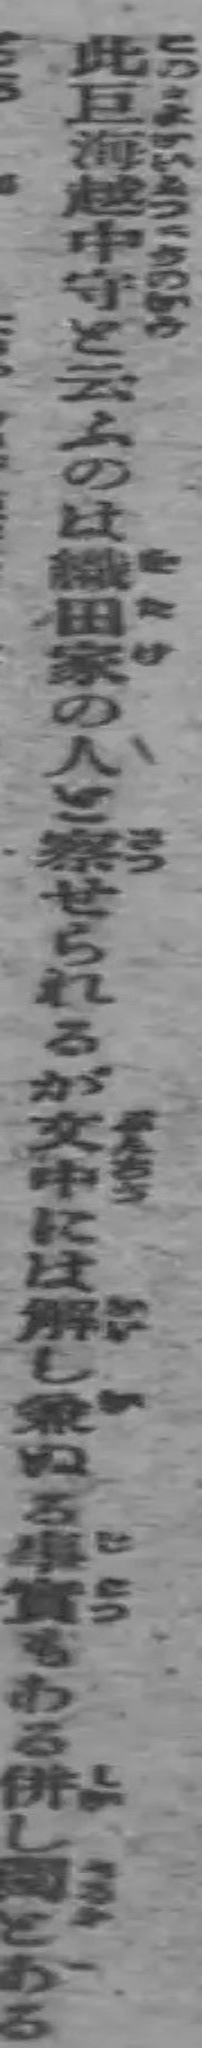此巨海越中守と云ふのは織田家の人と察せられるが文中には解し兼ぬる事実もある併し閏とある
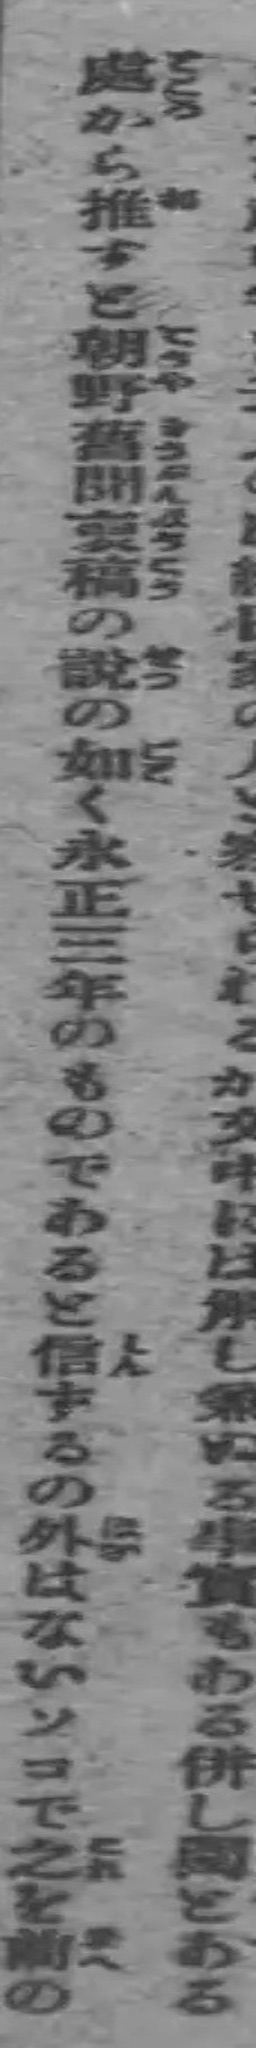処から推すと朝野旧聞裒稿の説の如く永正三年のものであると信ずるの外はないソコで之を前の
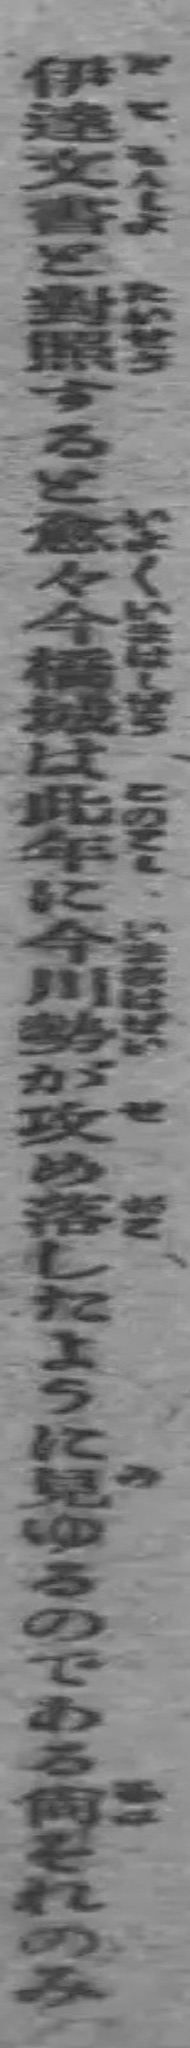伊達文書と対照すると愈々今橋城は此年に今川勢が攻め落したように見ゆるのである尚それのみ
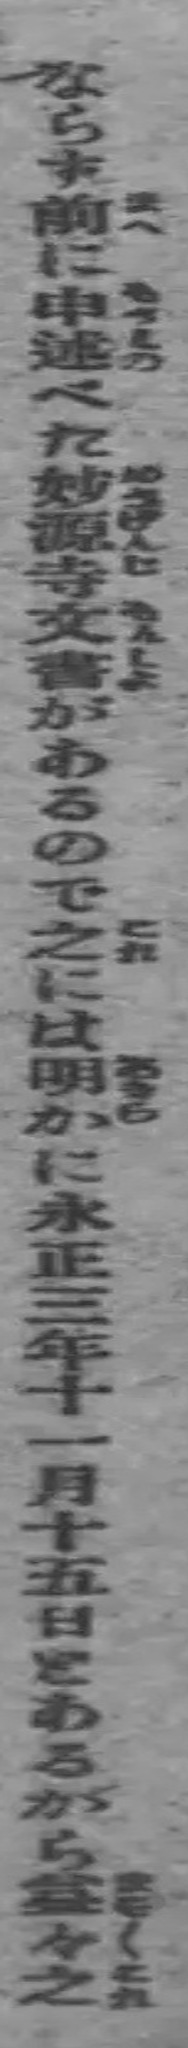ならず前に申述べた妙源寺文書があるので之には明かに永正三年十一月十五日とあるから益々之
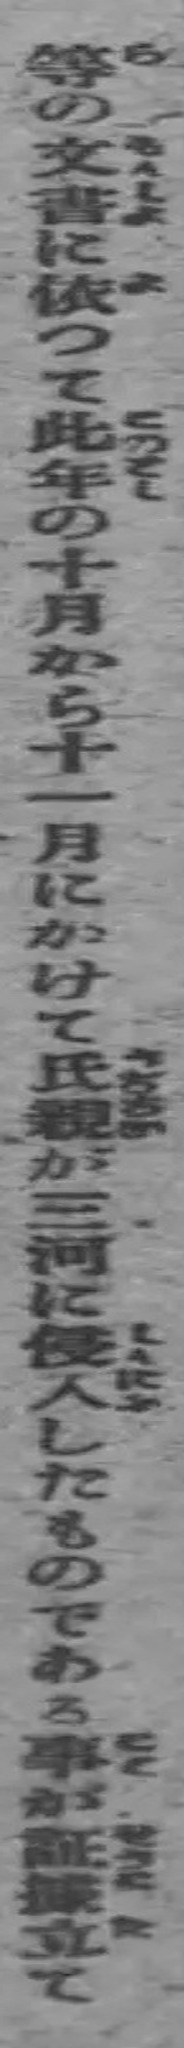等の文書に依つて此年の十月から十一月にかけて氏親が三河に侵入したものである事が証拠立て
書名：豊橋市史談
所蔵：国立国会図書館 National Diet Library, JAPAN
